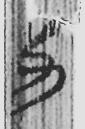力
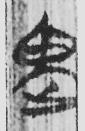畏
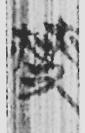{火火又}
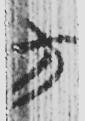方
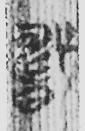{𠷎戈}
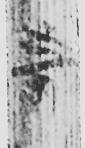先
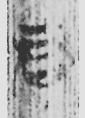君
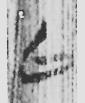㠯（以）
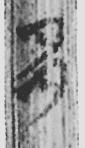多
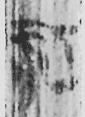{示工}
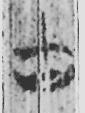古
